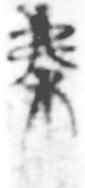柫
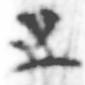之
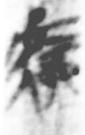駟
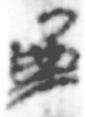爲
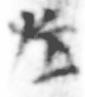○（左）
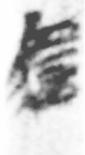驂
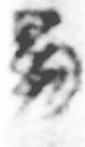○（豹）
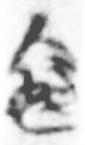裘
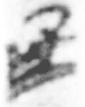爲
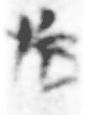○（左）
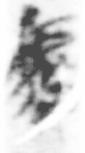○（服）
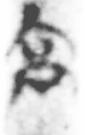高
